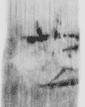{廿五}
